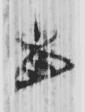眚
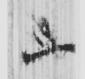之
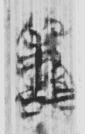溓
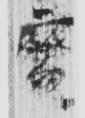{厤力}
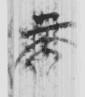而
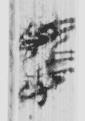{既心}
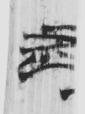者
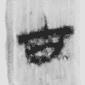古
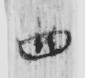四
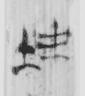{土丰}
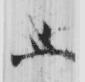之
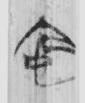{宀𠁩}
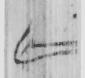亡
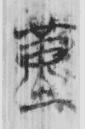堇
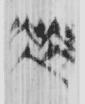{炎衣}
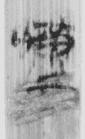慬
